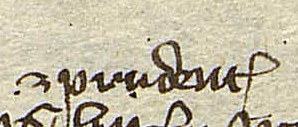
prudent*
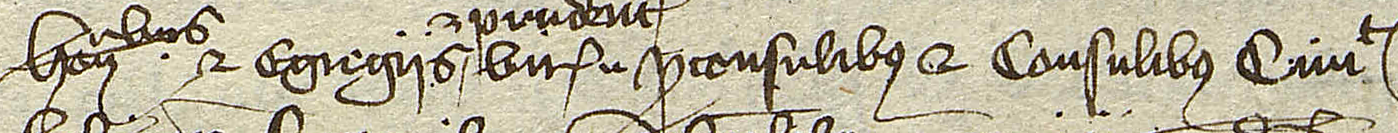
Hon* @ Egregiis / vir* ~ p*conſulib* @ conſulib* Ciui*t*
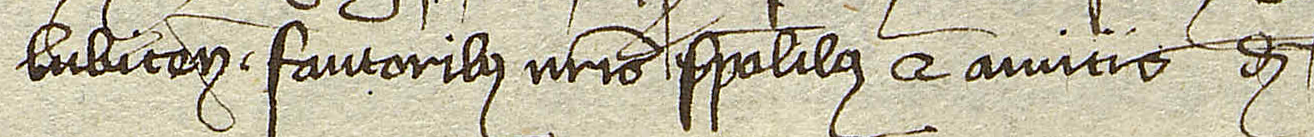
Lubicen* / fautorib* n*ris ſp*alibl* @ amicis d*
